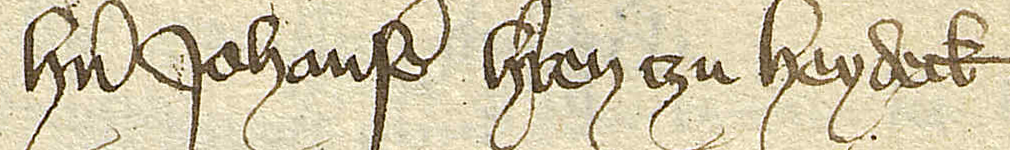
hn* Iohanſe* hr*en cʒu Heydeck
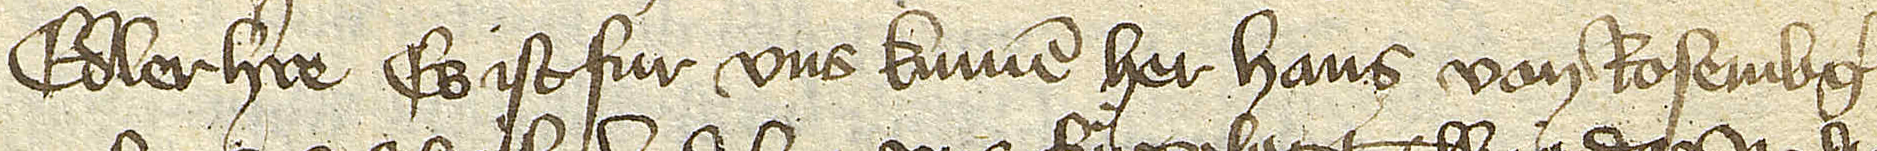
Edler h*re Es iſt für vns kume* her hans von Roſemb*g
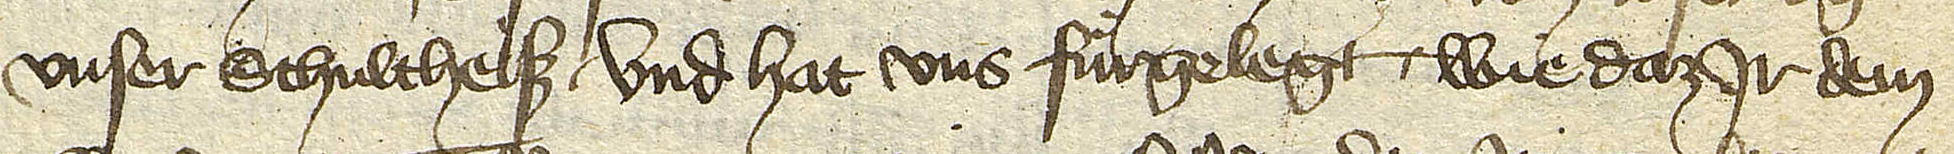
vnſer Schultheiſʒ / vnd hat vns fürgelegt / wie daʒ Ir dem
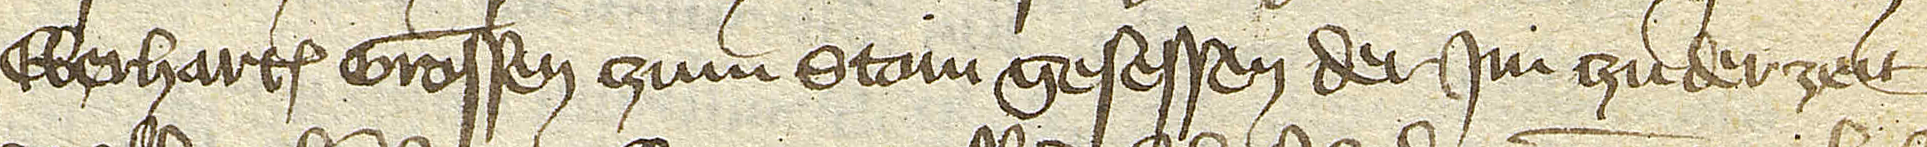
Eberhart* Groſſen cʒum Stain geſeſſen der Im cʒu der cʒeit
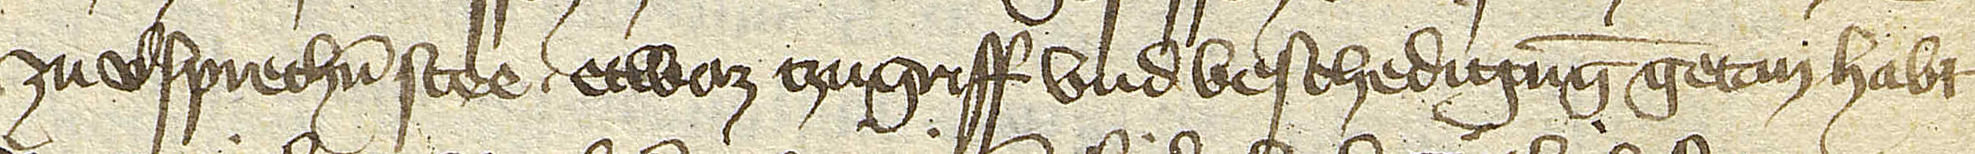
cʒu v*ſprechn* ſtee / etwaʒ cʒugriff vnd beſchedigug* getan habt
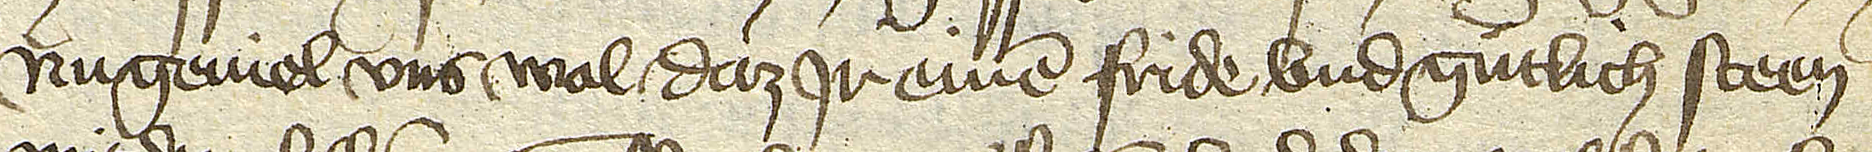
Nu geuiel vns wol / daʒ Ir eine* fride vnd gütlich ſteen
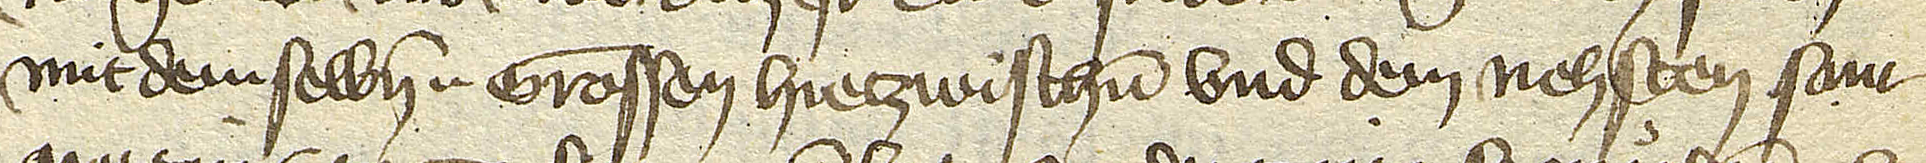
mit demſelbn* ~ Groſſen hiecʒwiſchn* vnd dem nehſten ſant
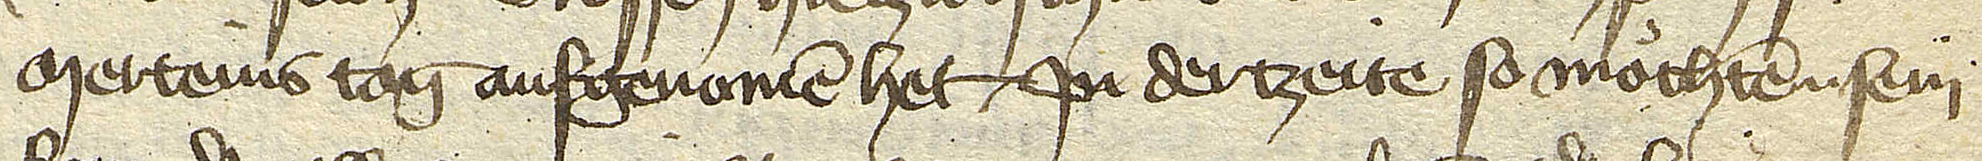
Merteins tag aufgenome* het / In der cʒeite ſo möchte* ~ ſein
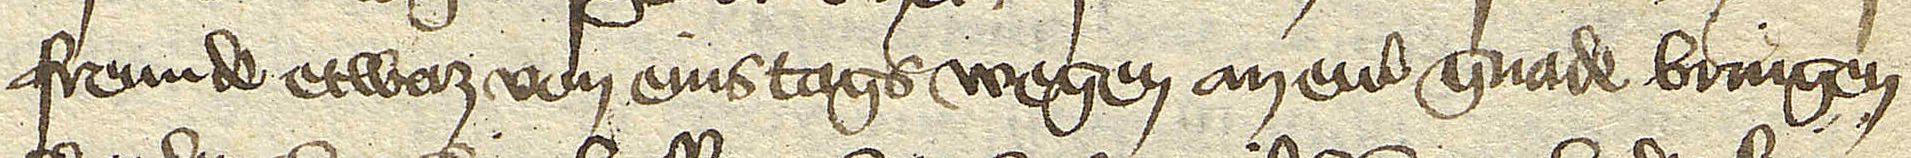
freunde etwaʒ von eins tags wegen an ew* gnade bringen
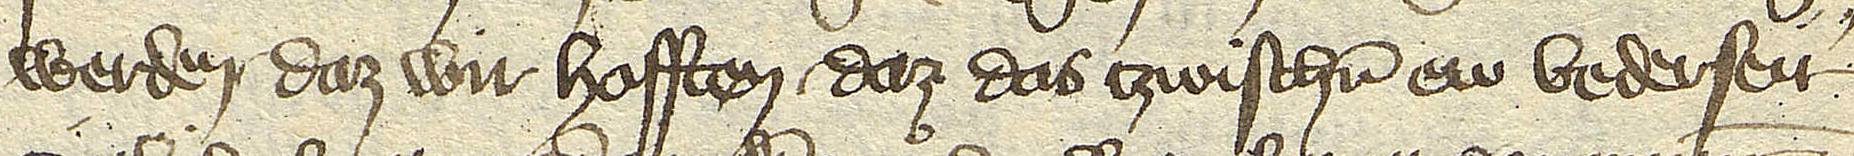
werden / daʒ wir hofften / daʒ das cʒwiſchn* ew bederſeit
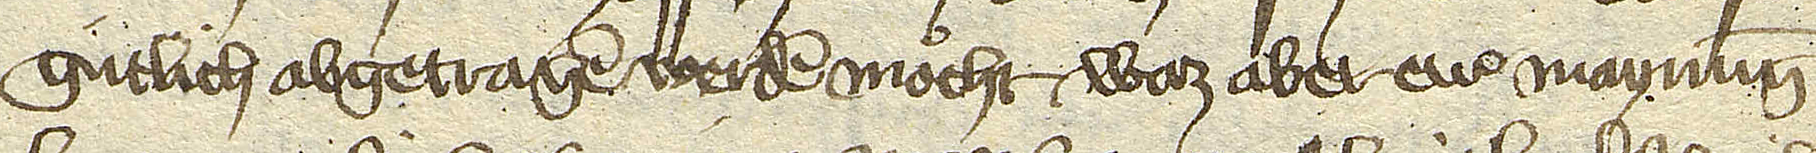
gütlich abgetrage* werd* möcht / waʒ aber ew* maynug*
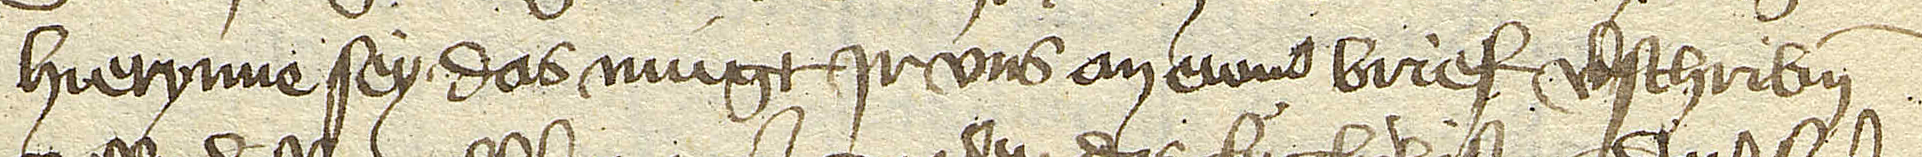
hierynne ſey / das mügt Ir vns an ewm* brief v*ſchribn*
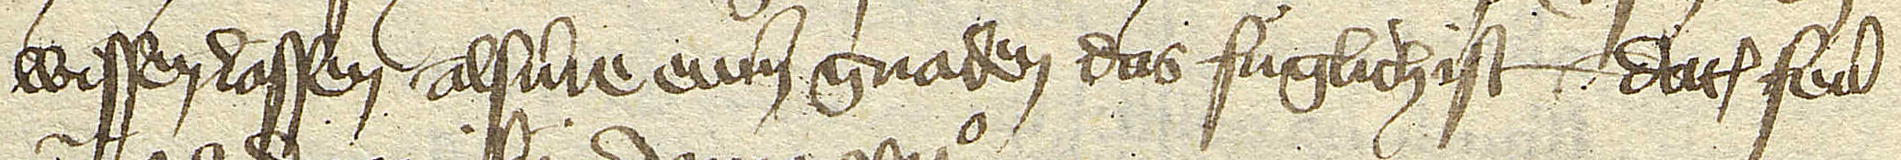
wiſſen laſſen / alſu*re ewn* gnaden das füglich iſt / dat* fea*
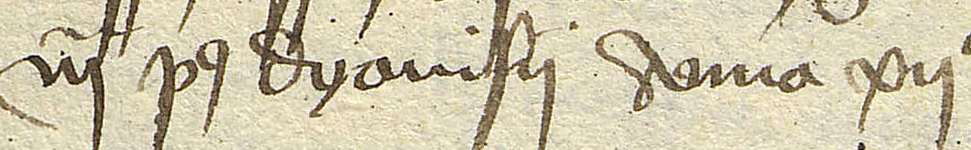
iii* p* dyoniſii Anno xii*
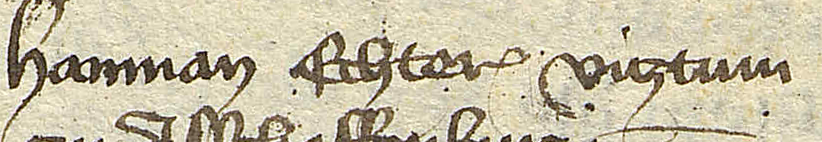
hanman Echter* vicʒtum
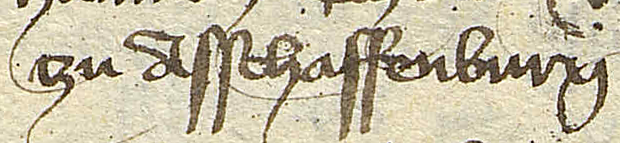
cʒu Aſſchaffenburg
